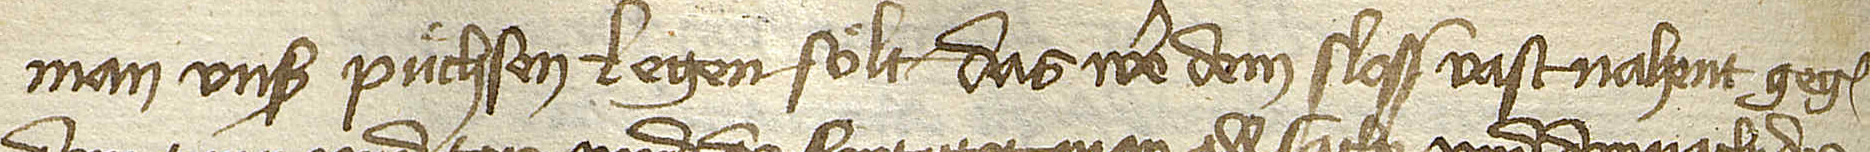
man vnſ* püchſen legen ſölt / das we* dem ſloſſ vaſt nahent geg*
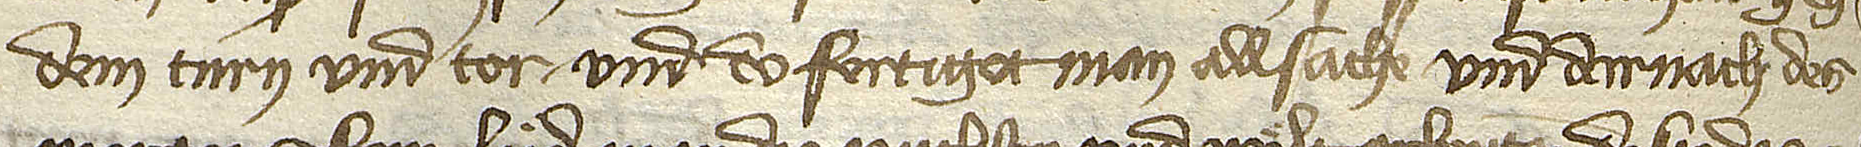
dem turn vnd tor / vnd do fertiget man allſache vnd darnach des
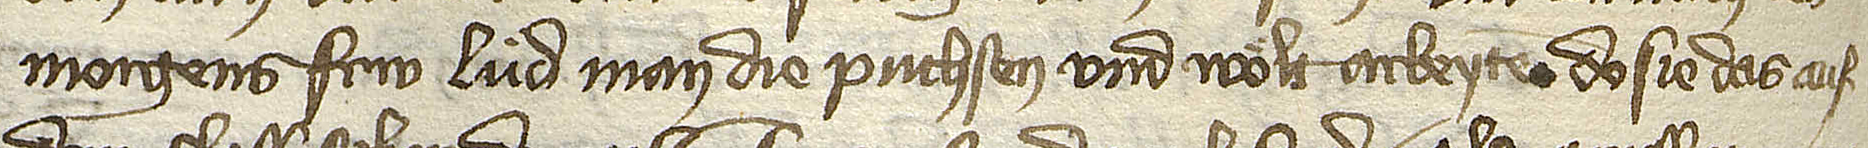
morgens frw lüd man die puchſen vnd wölt arbeyte* . do ſie das auf
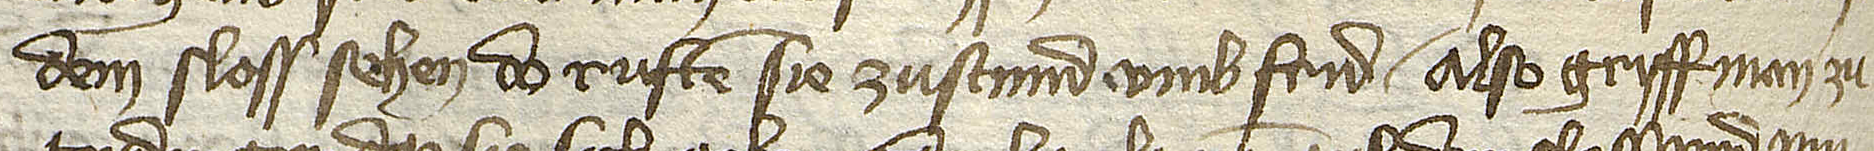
dem ſloſſ ſehen do rufte* ſie ʒuſtund . vmb frid / alſo gryff man ʒu
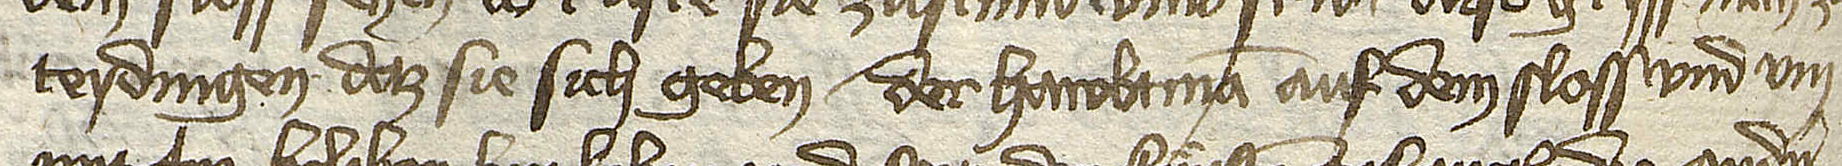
teydingen . daʒ ſie ſich geben / der hawbtma* auf dem ſloſſ vnd viii
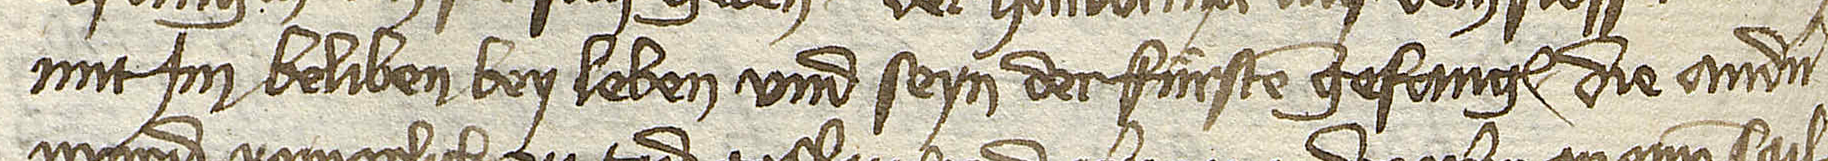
mit Im beliben bey leben vnd ſeyn der fürſte* gefang* die and*n
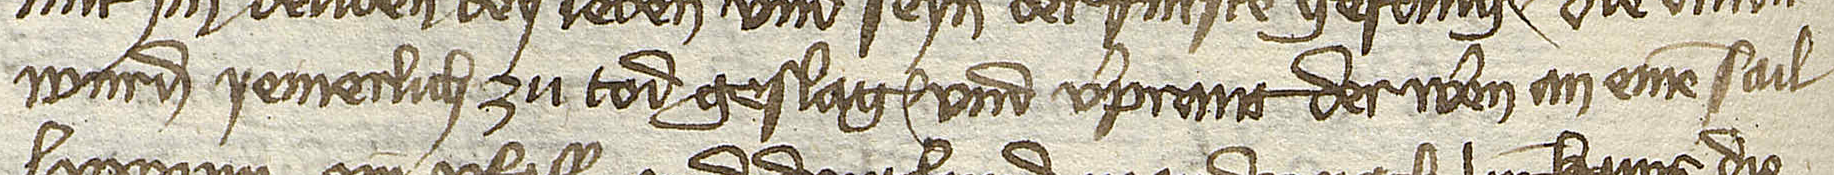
wurd* yemerlich ʒu tod geſlag* vnd v*prant der w*en an eine* ſail
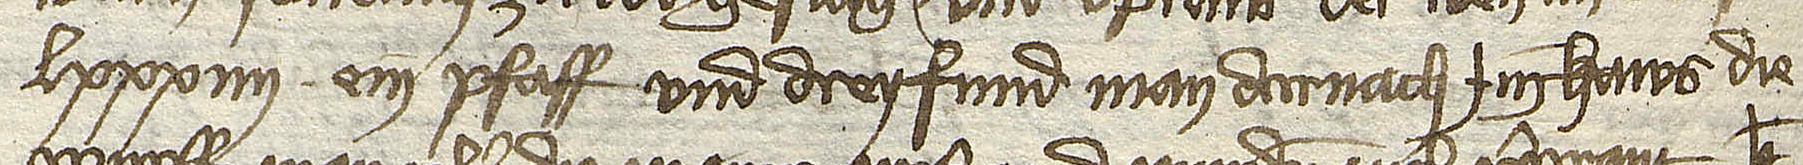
lxxxiiii . ein pfaff vnd drey ſund man darnach Im haws die
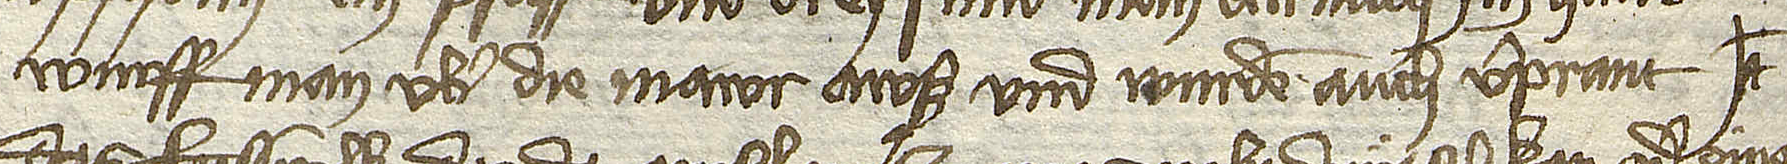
wurff man vb* die mawr awſʒ vnd wurde* . auch v*prant It*
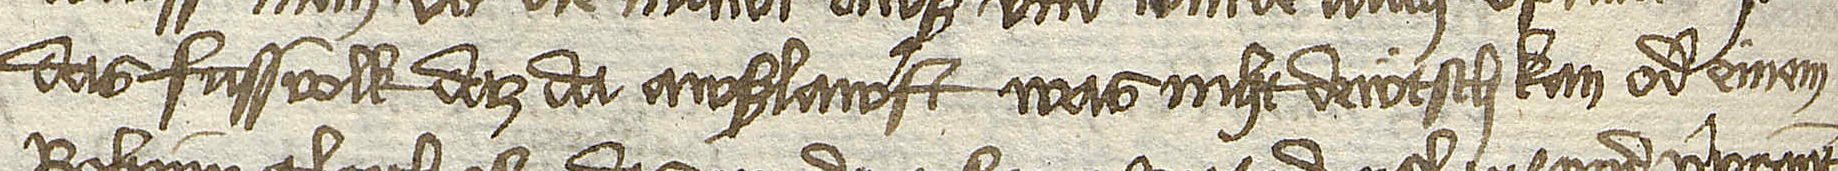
das fuſſvolk daʒ da awſʒlawft was niht dewtſch kan od* einem
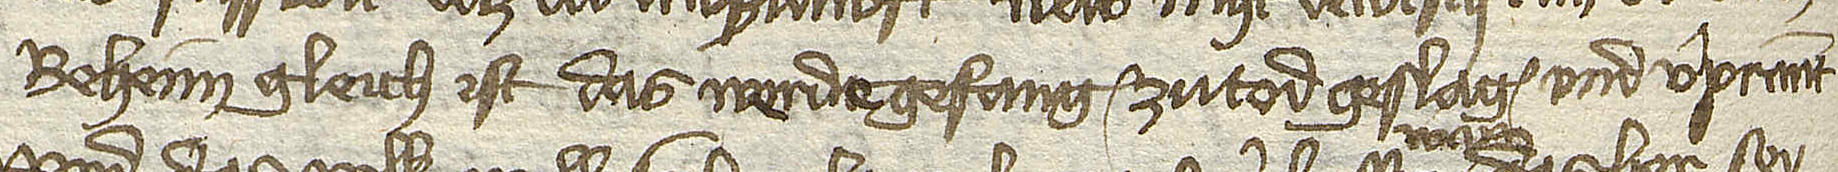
Beheim gleich iſt das werde* gefang* ʒutod geſlag* vnd v*prant*
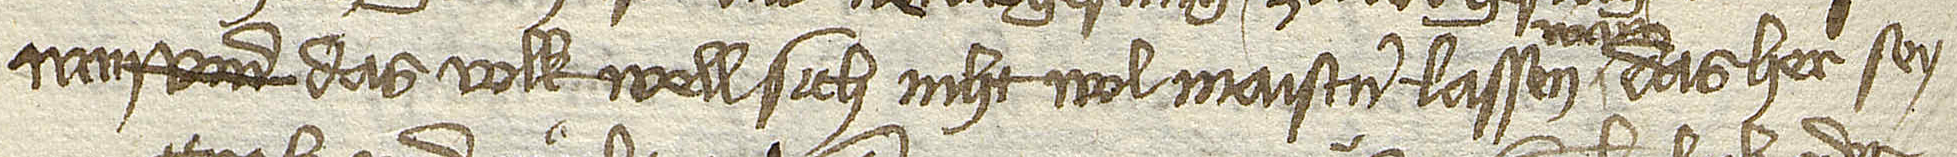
wan vnd das volk well ſich niht wol maiſt*n laſſen das her ſey
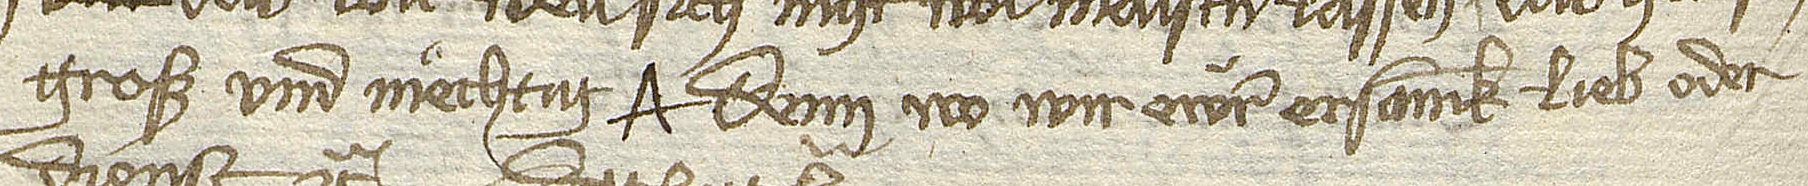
groſʒ vnd mëchtig Denn wo wir ewr* erſamk* lieb oder
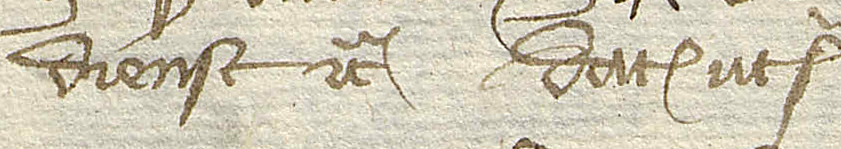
dienſt ec* / Dat* ut ſ*
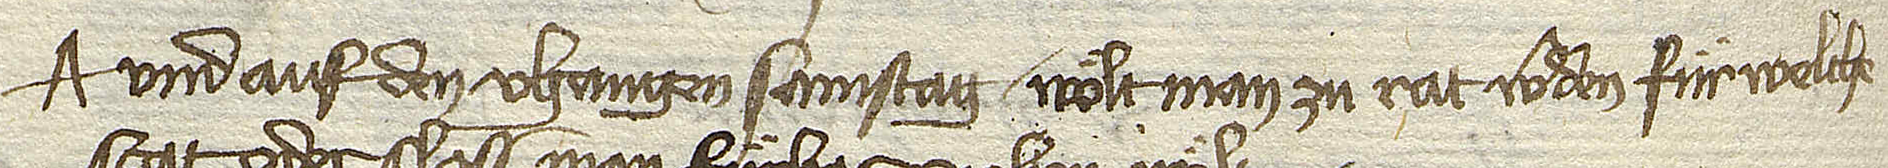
vnd auf den v*gangen ſamſtag / wölt man ʒu rat w*den für welche
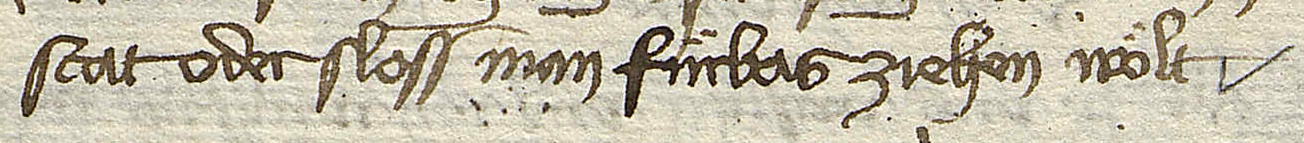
ſtat oder ſloſſ man fürbas ʒiehen wölt /
